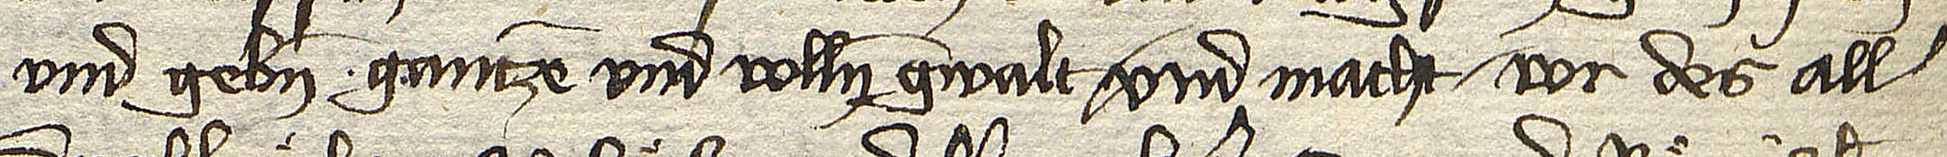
vnd gebn* gancʒe* vnd volln* gwalt / vnd macht / vor des all*
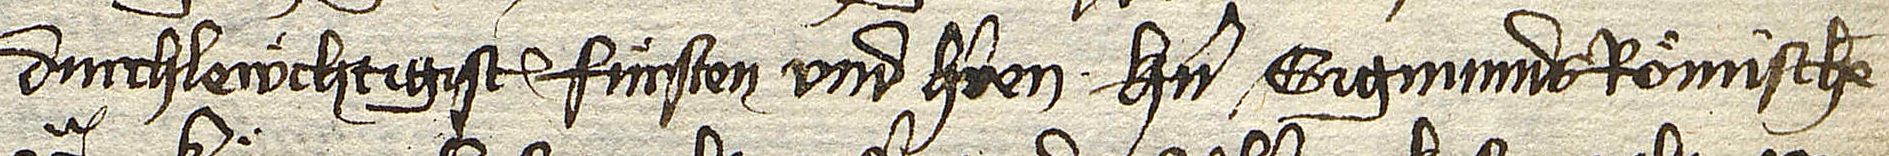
durchleẅchtigiſt* fürſten vnd h*ren . Hn* / Sigmunds Römiſche*
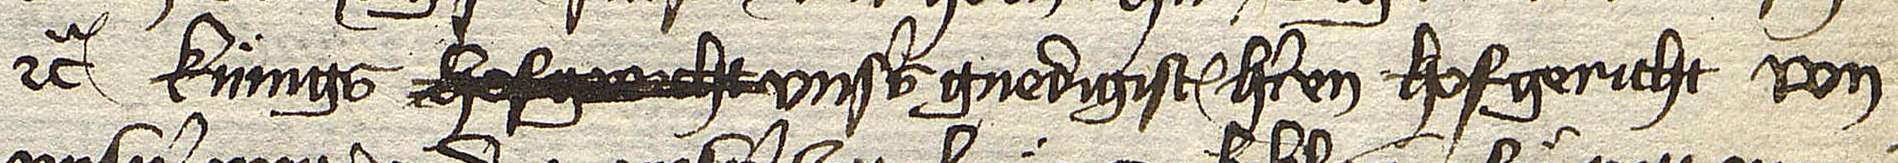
ec* künigs hofgericht vnſ*s gnedigiſt* h*ren . hofgericht von
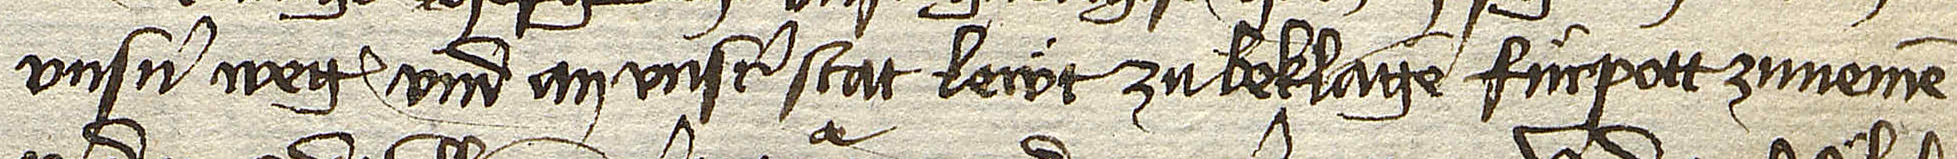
vnſn* weg* vnd an vnſr* ſtat leẅt ʒu beklage* fürpott ʒuneme*
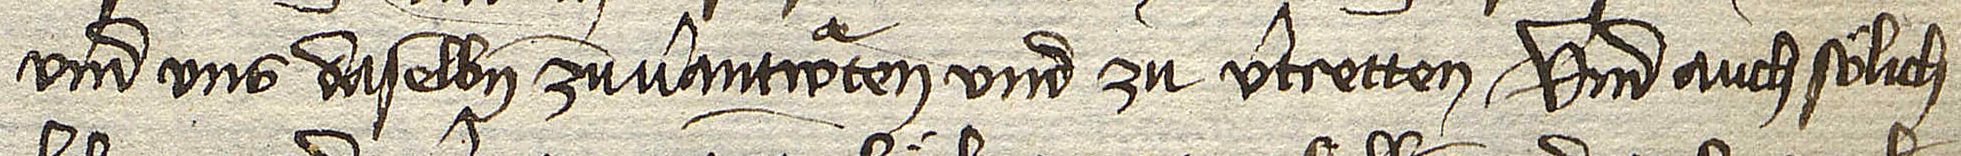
vnd vns daſelbn* ʒuu*antw*ten vnd ʒu v*tretten / Vnd auch ſölich
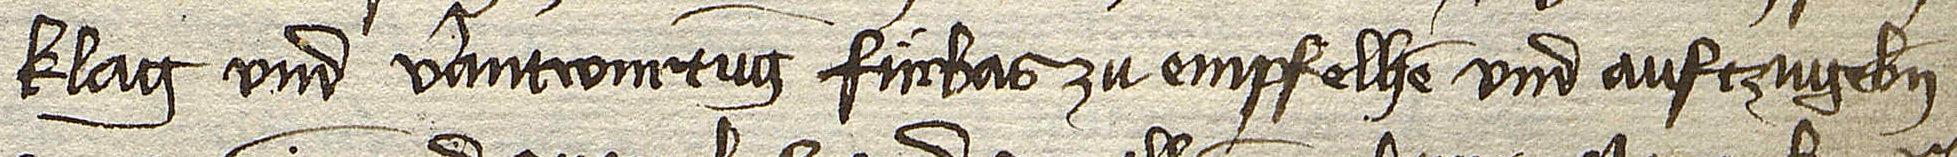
klag vnd v*antwurtu*g fürbas ʒu empfelhe* vnd aufcʒugebn*
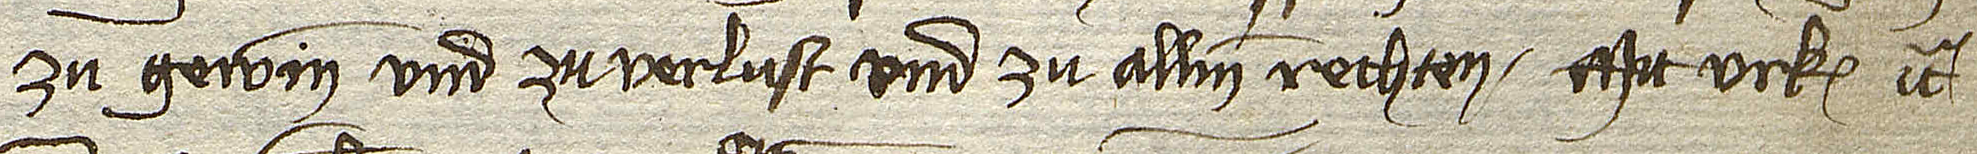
ʒu gewin* vnd ʒu verluſt vnd ʒu allm* rechten / Mit vrk* ec*
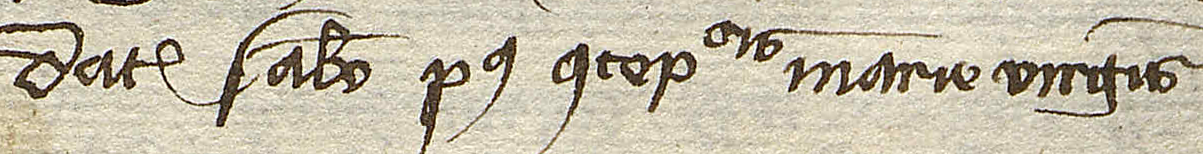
Dat* ſabo* p* *cep* marie virg*is
